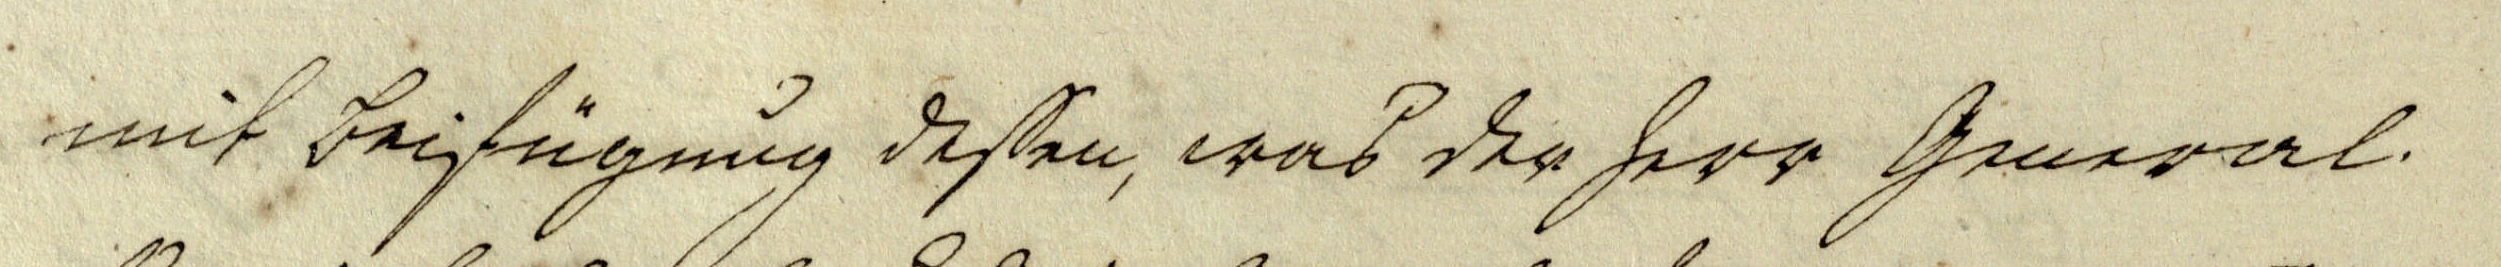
mit Beifügung dessen, was der Herr General¬
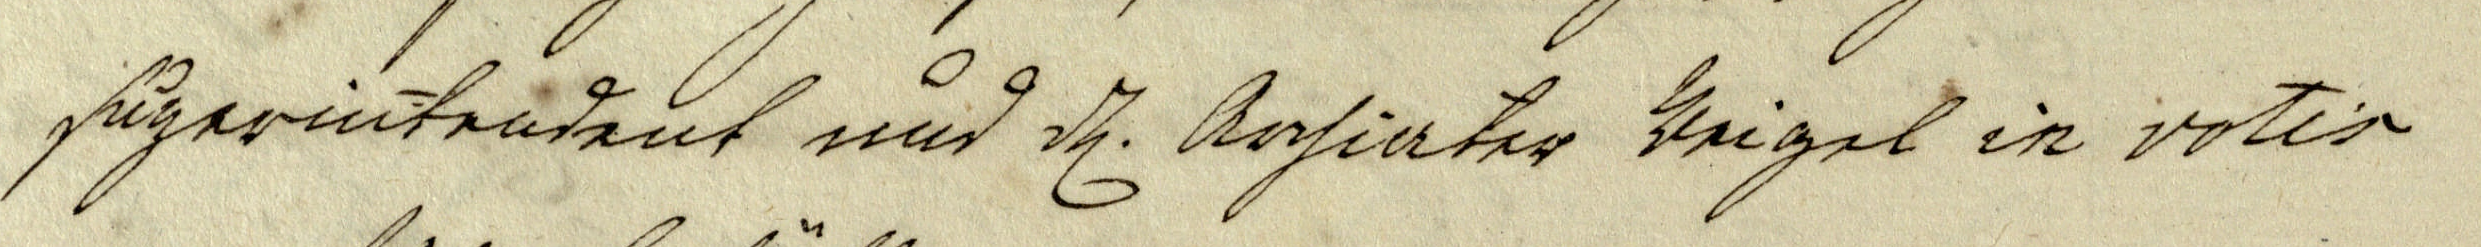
Superintendent und dh. Archiater Weigel in votis
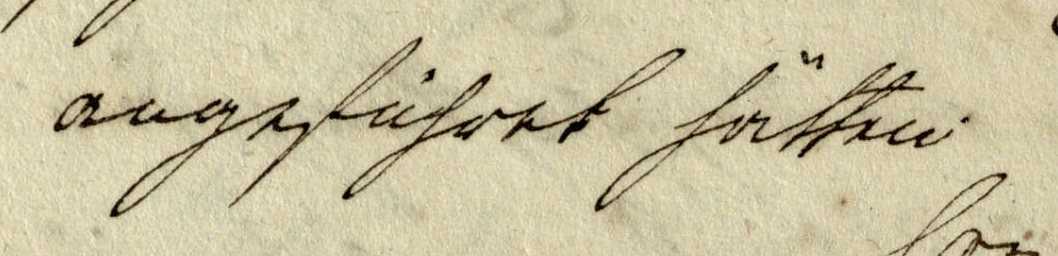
angeführet hätten.
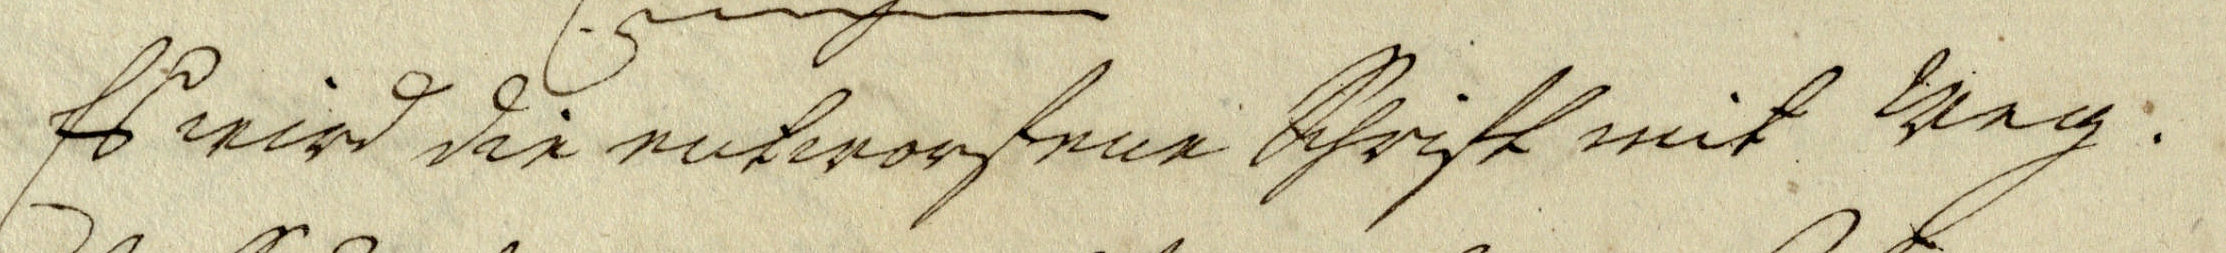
Es wird die entworfene Schrift mit Weg¬
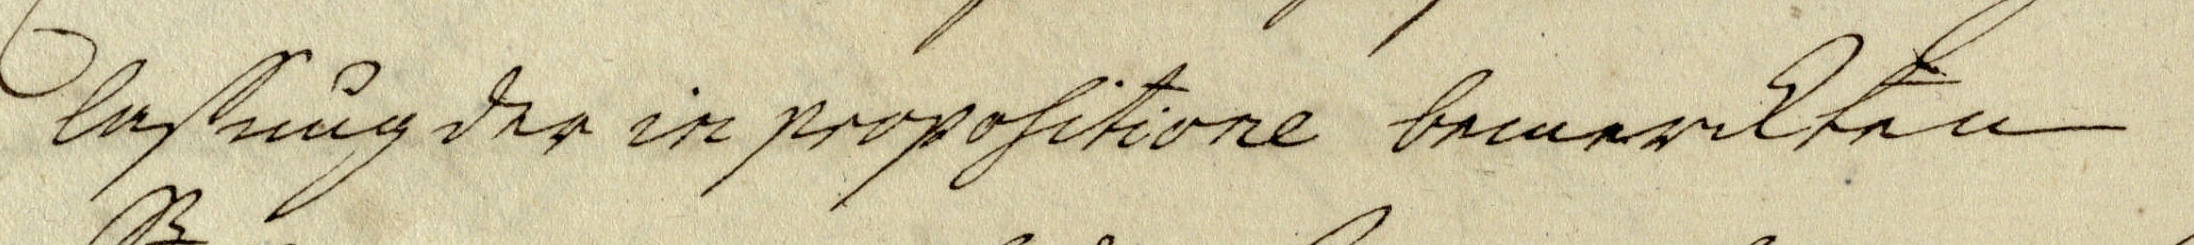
lassung der in propositione bemerckten,
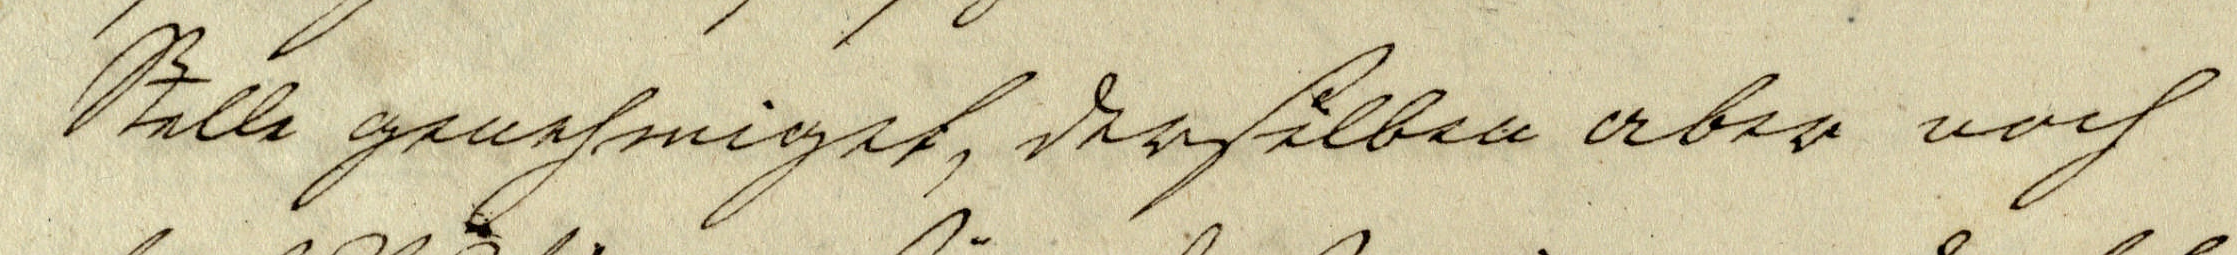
Stelle genehmiget, derselben aber noch
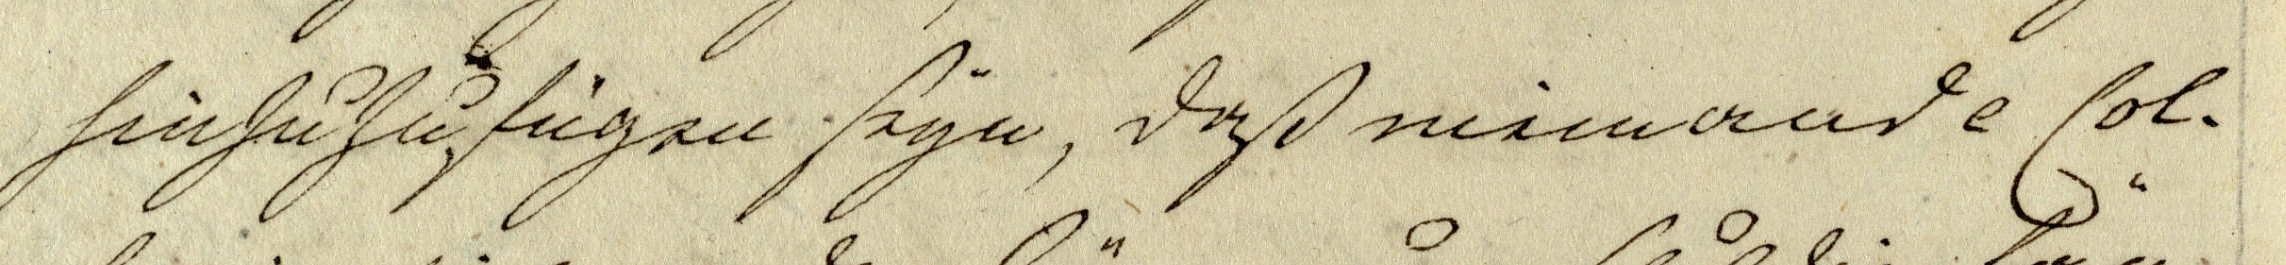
hinzuzufügen seÿn, daß niemand a Col¬
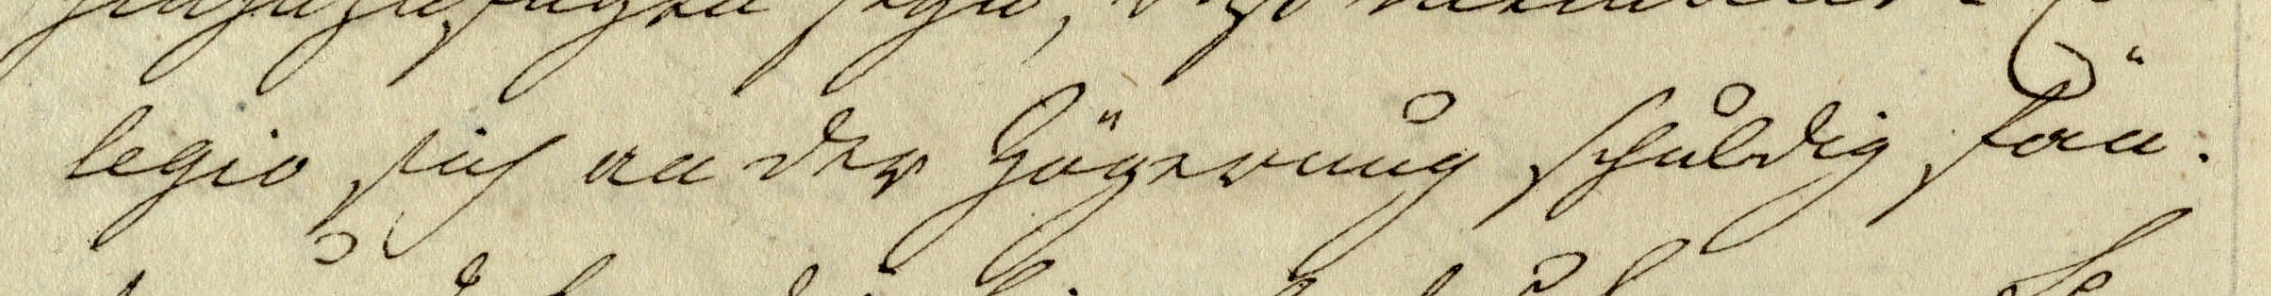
legio sich an der Zögerung schuldig fän¬
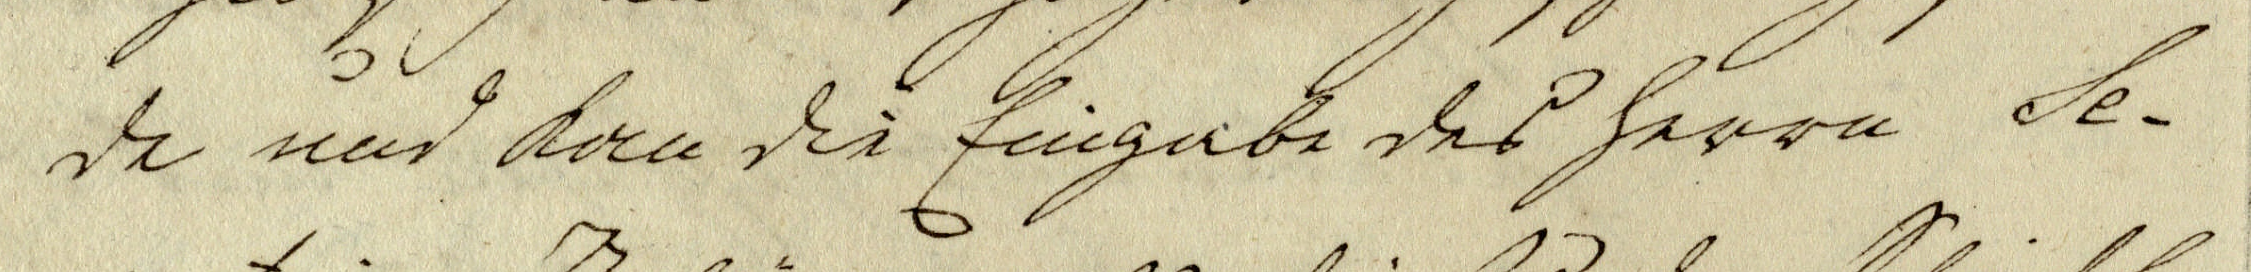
de und kan die Eingabe des Herrn Se¬
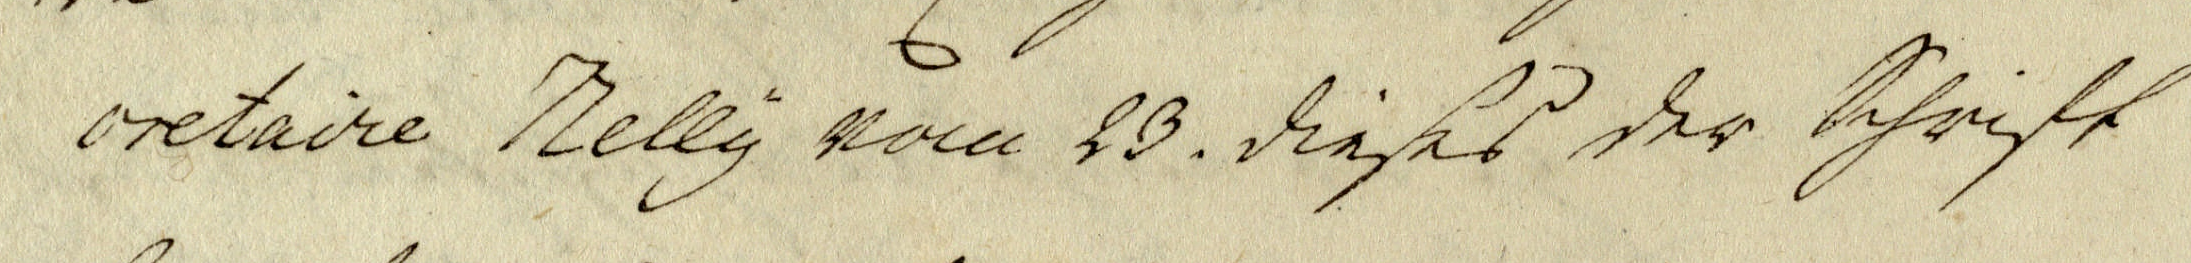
cretaire Nellÿ vom 23. dieses der Schrift
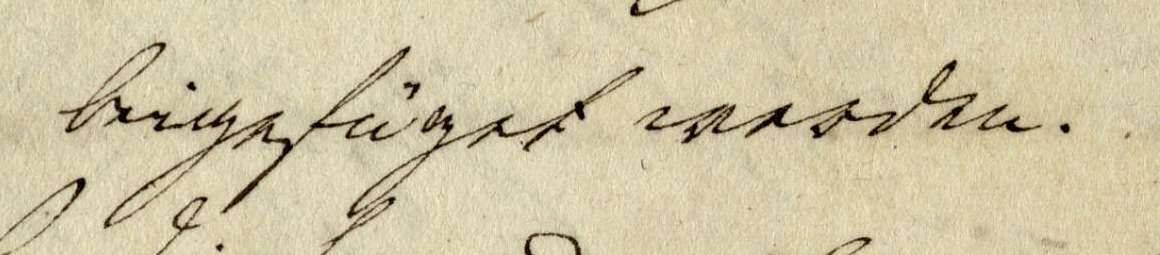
beigefüget werden.
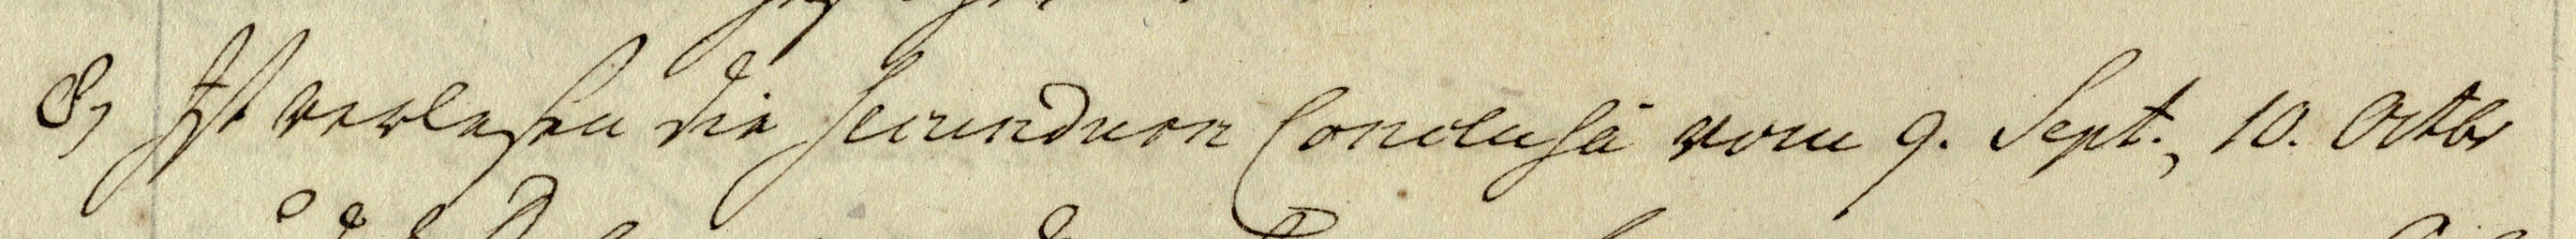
8., Ist verlesen die secundum Conclusa vom 9. Sept., 10. Octbr.
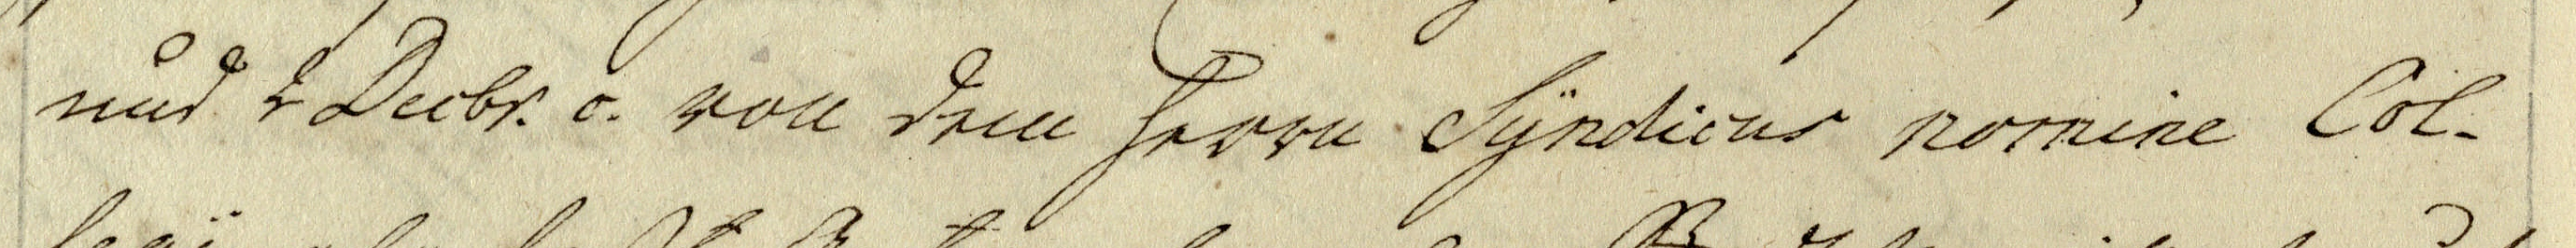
und 2 Decbr. c. von dem Herrn Sÿndicus nomine Col¬
